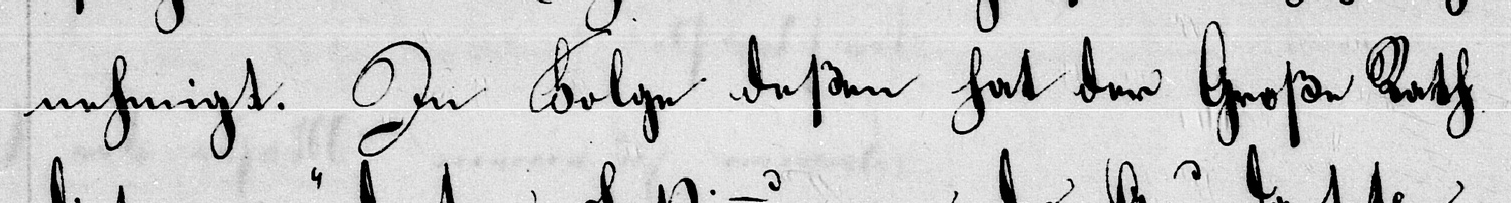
nehmigt. In Folge deßen hat der Große Rath
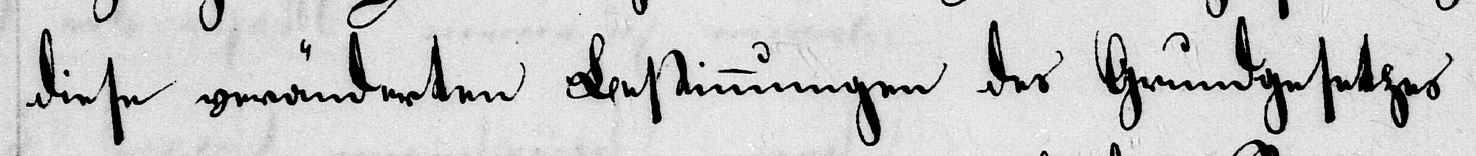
diese veränderten Bestimmungen des Grundgesetzes
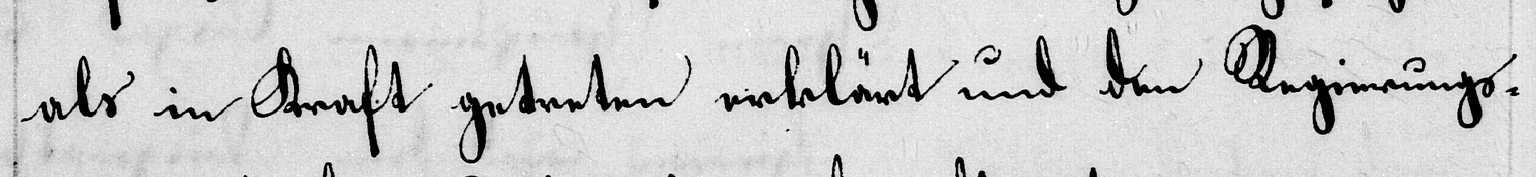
als in Kraft getreten erklärt und den Regierungs¬
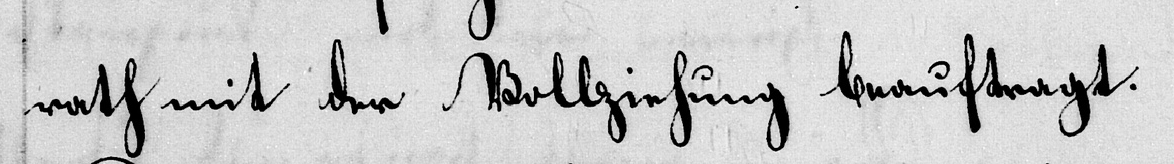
rath mit der Vollziehung beauftragt.
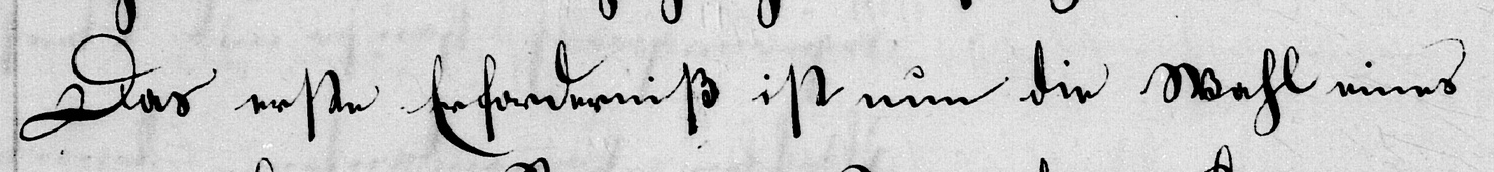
Das erste Erforderniß ist nun die Wahl eines
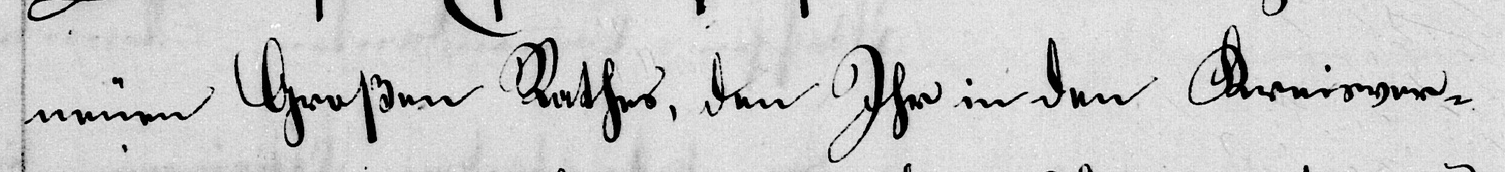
neuen Großen Rathes, den Ihr in den Kreisver¬
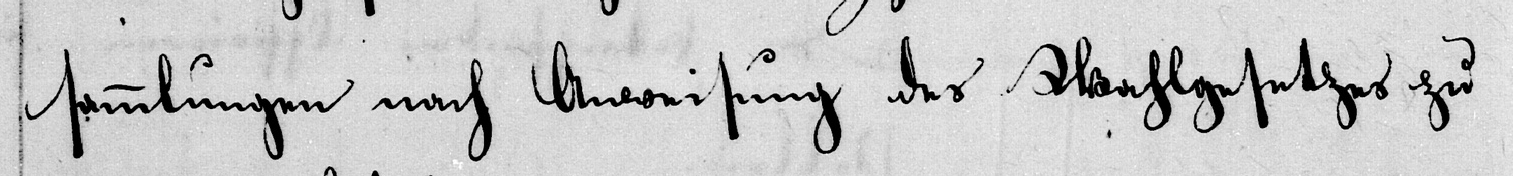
sammlungen nach Anweisung des Wahlgesetzes zu
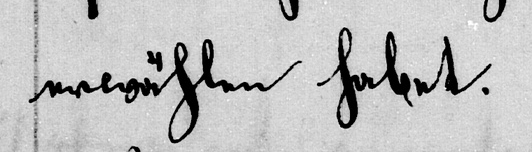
erwählen habet.
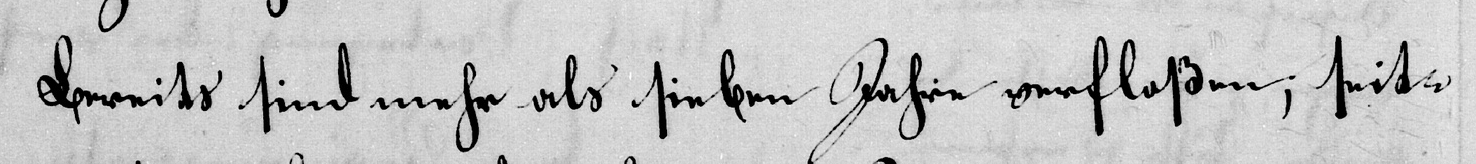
Bereits sind mehr als sieben Jahre verfloßen, seit¬
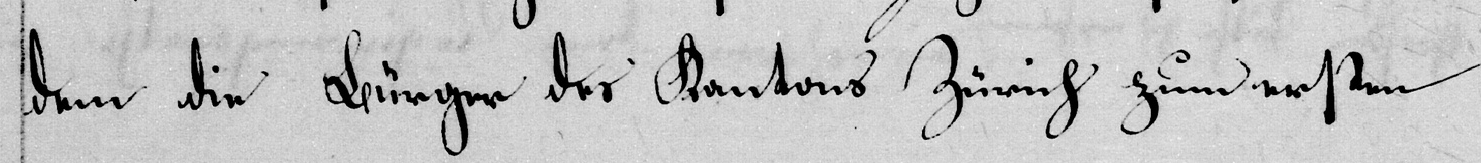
dem die Bürger des Kantons Zürich zum ersten
